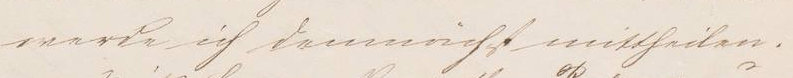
werde ich demnächst mittheilen.
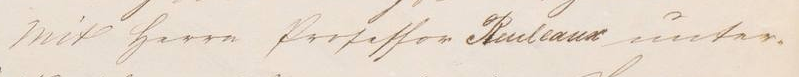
Mit Herrn Professor Reuleaux unter-
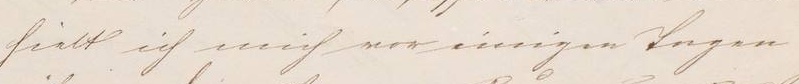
hielt ich mich vor einigen Tagen
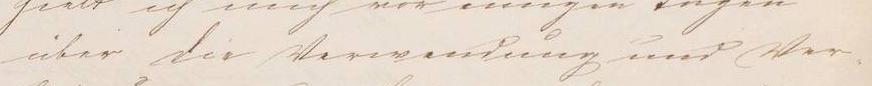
über die Verwendung und Ver-
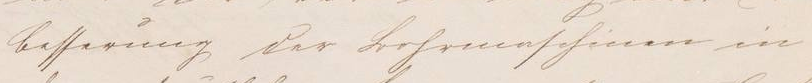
besserung der Bohrmaschinen in
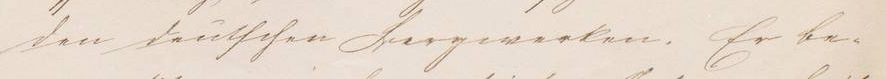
den deutschen Bergwerken. Er be-
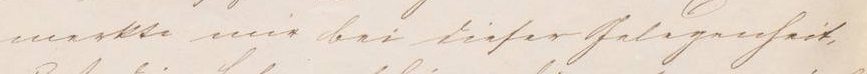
merkte mir bei dieser Gelegenheit,
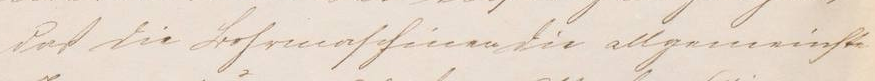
daß die Bohrmaschinen die allgemeinste
